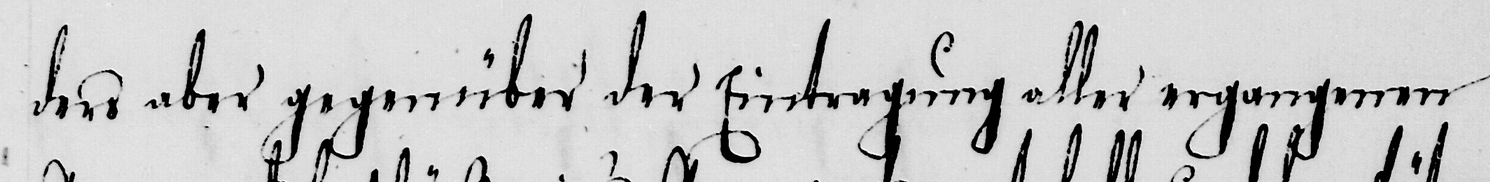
ders aber gegenüber der Eintragung aller ergangenen
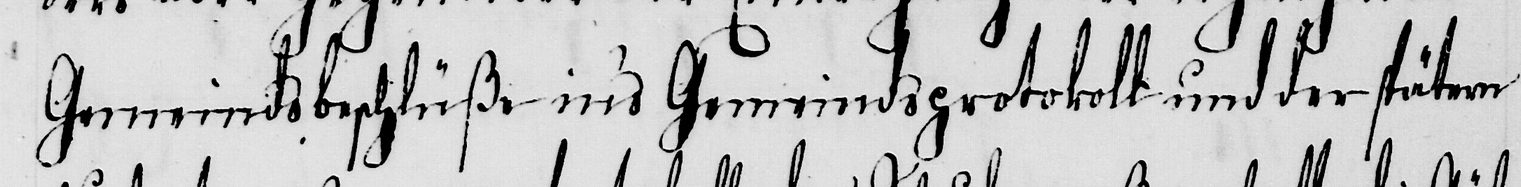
Gemeindsbeschlüße ins Gemeindsprotokoll und der spätern
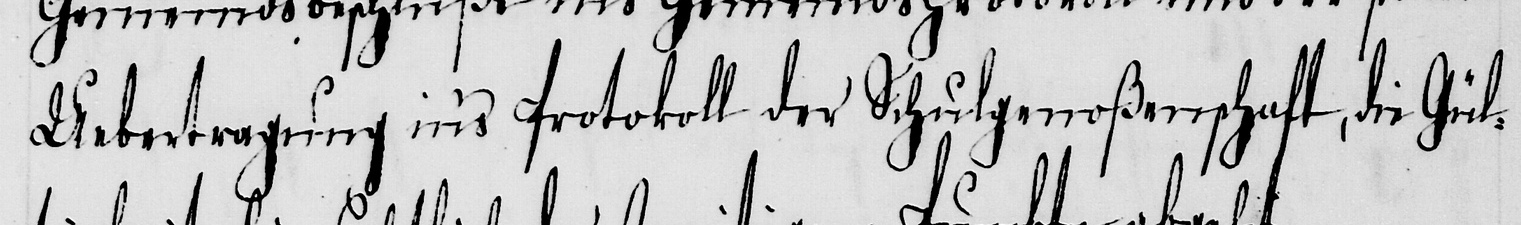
Uebertragung ins Protokoll der Schulgenoßenschaft, die Gül¬
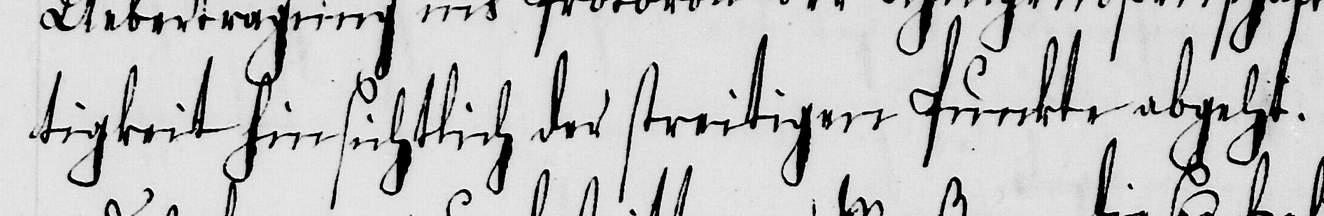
tigkeit hinsichtlich der streitigen Punkte abgeht.
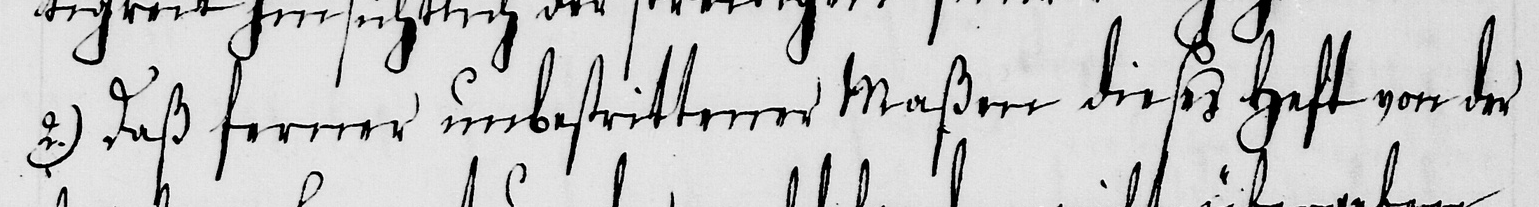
2.) Daß ferner unbestrittener Maßen dieses Heft von der
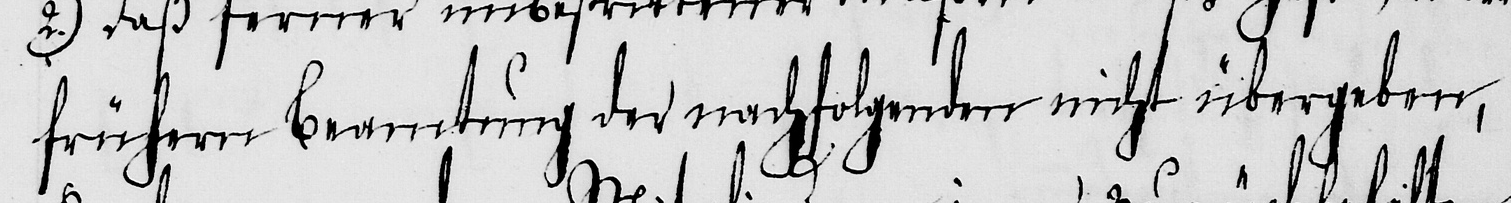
frühern Beamtung der nachfolgenden nicht übergeben,
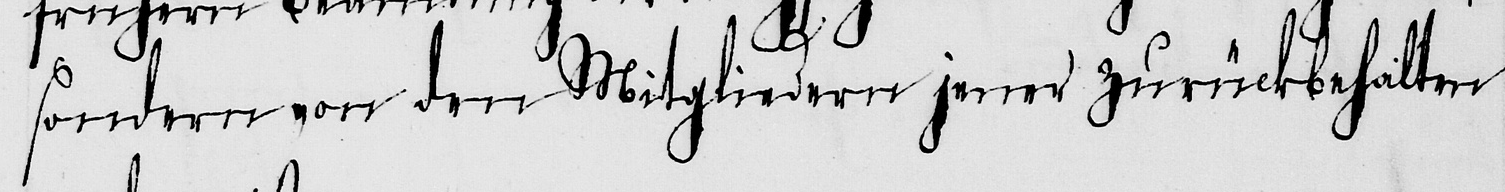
sondern von den Mitgliedern jener zurückbehalten
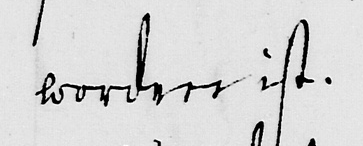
worden ist.
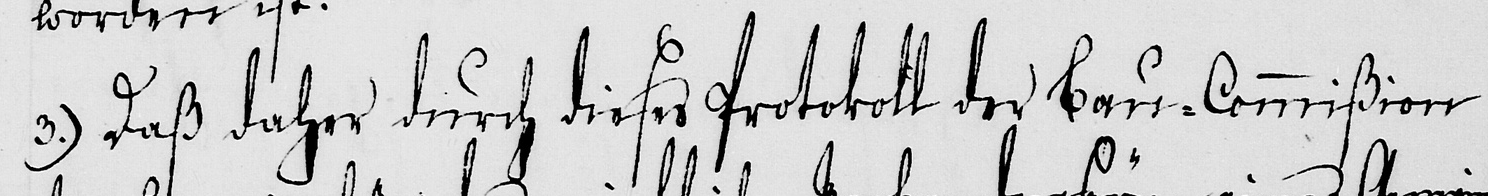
3.) Daß daher durch dieses Protokoll der Bau-Commißion
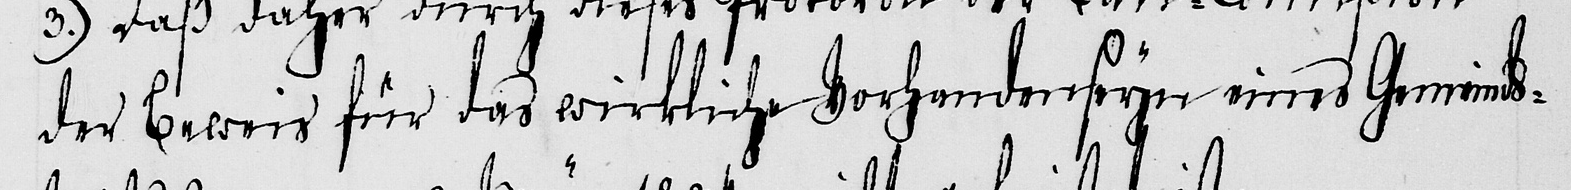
der Beweis für das wirkliche Vorhandenseyn eines Gemeind¬
